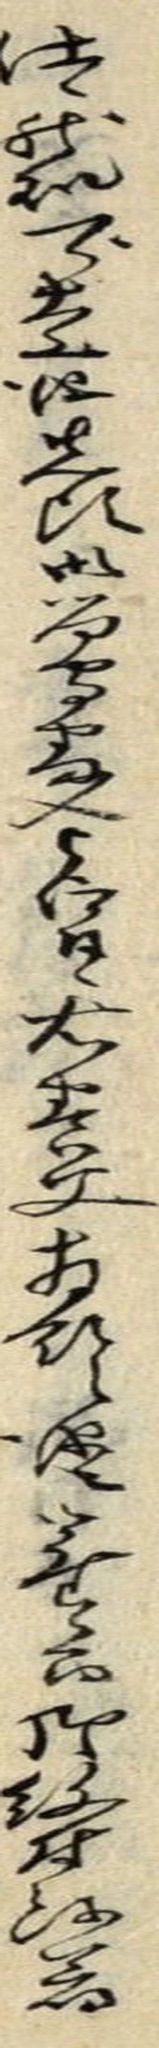仕候然処一郎太夫儀先頃御留守居番入被仰付候右養父拝領之儀に御座候間御紋付致着
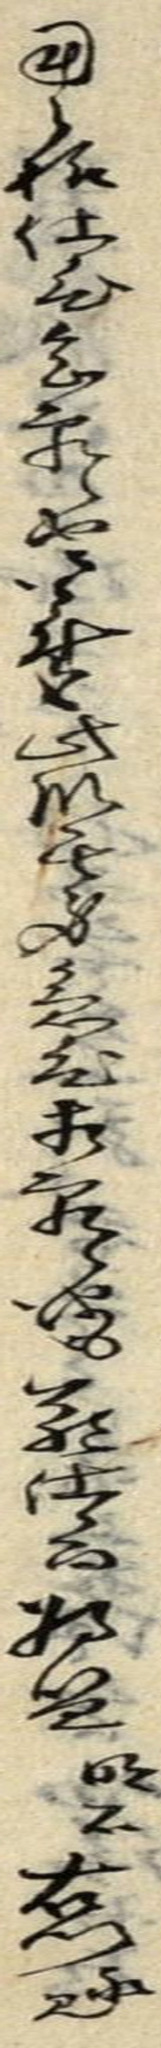用候様仕度念願候由に御座候此段其身急度相願候儀も難仕候間将監明石右門永見
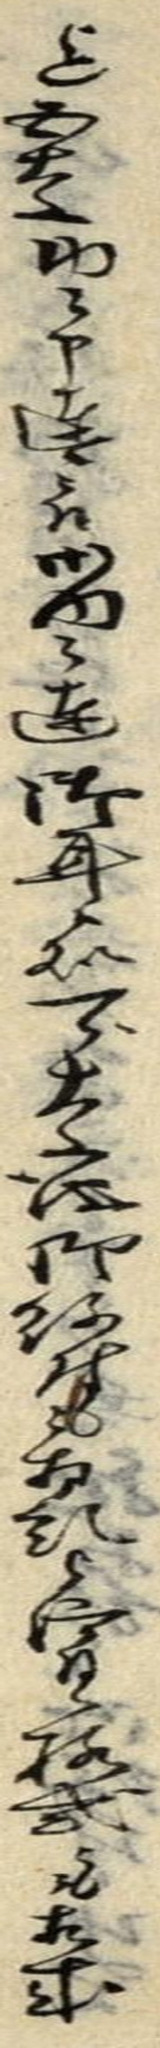迄五太夫内々に申達候ニ付御内々達御耳候処一郎太夫儀御紋付も拝領被仰付候格式にも相成
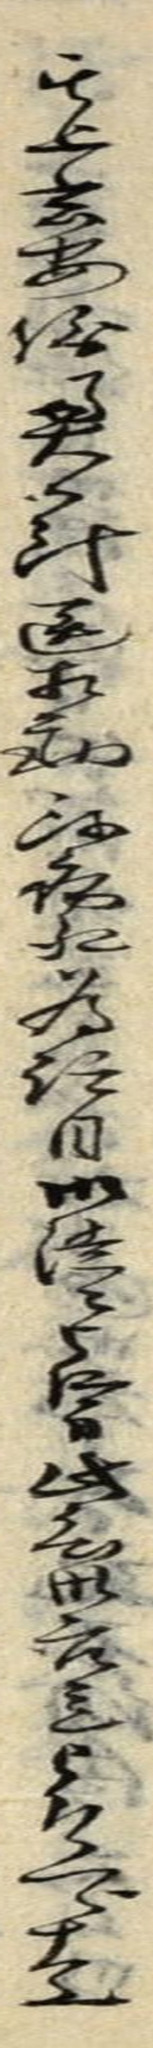其上玄安儀奥御針医相勤致病死為跡目御徒に被仰付此度御取立被下候一郎太夫
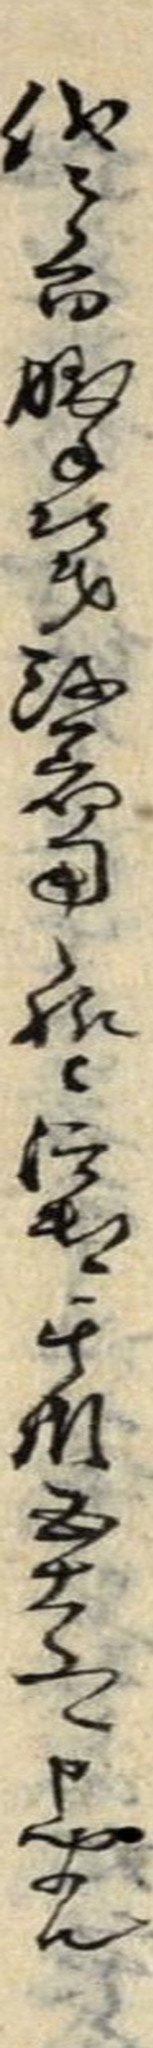儀に候間勝手次第致着用候様被仰出候其段五太夫へ申聞る

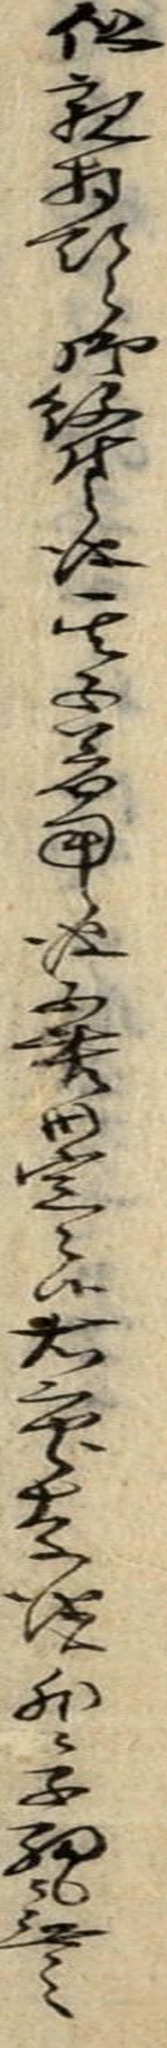但親拝領之御紋付之儀其子着用之儀不苦御定に候右一郎太夫儀は外に子細も無之
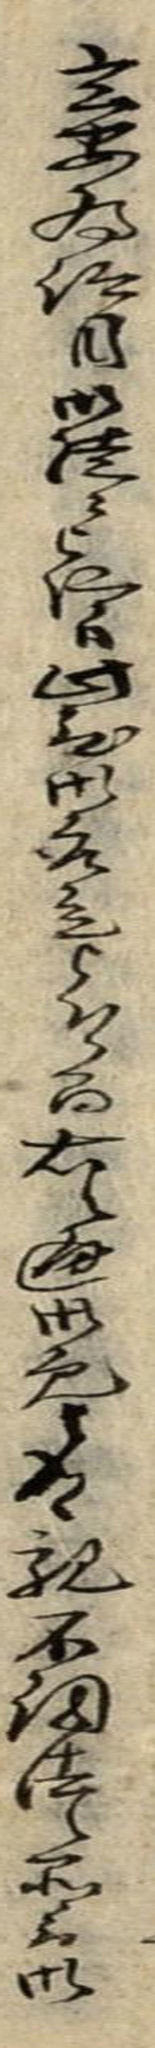玄安為跡目御徒に被仰付此度御取立被下候間右之通御免被成候親不調法之品に而御
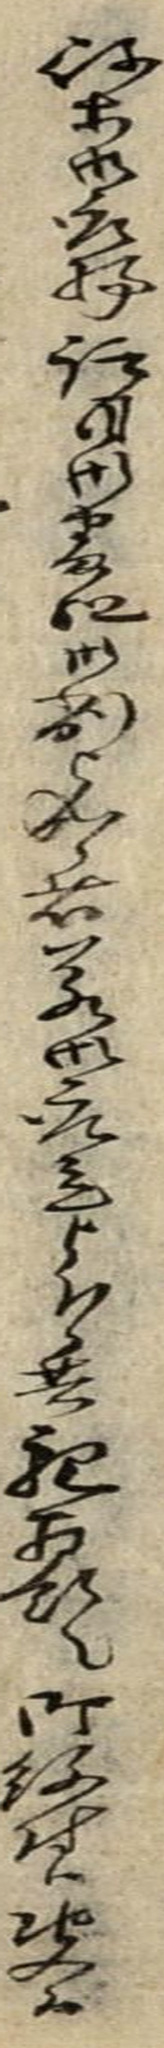役等御取揚跡目御番組御削被成候者若御取立被下候共親拝領之御紋付は決而
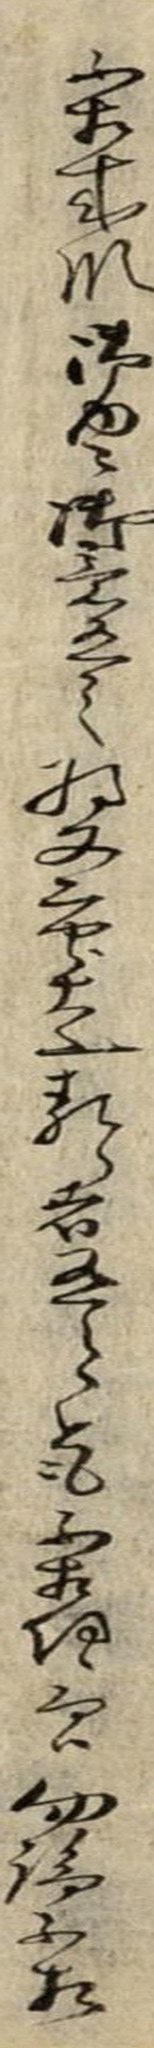不相成段御内々御意有之猶又市郎太夫類之者有之候とも不相伺候而は勿論不相
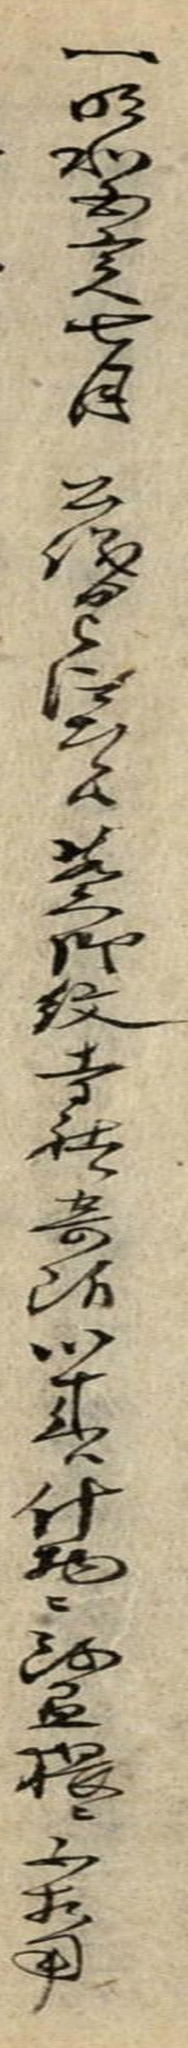一明和五亥七月公儀ゟ被仰出候葵御紋寺社へ寄附以来は什物に致置猥に不相用
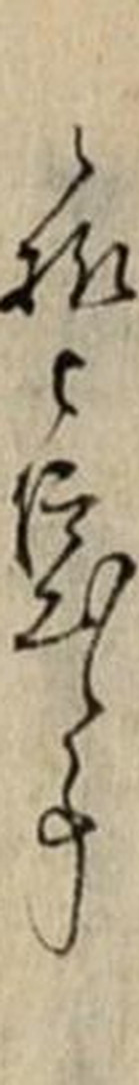候様被仰出候事
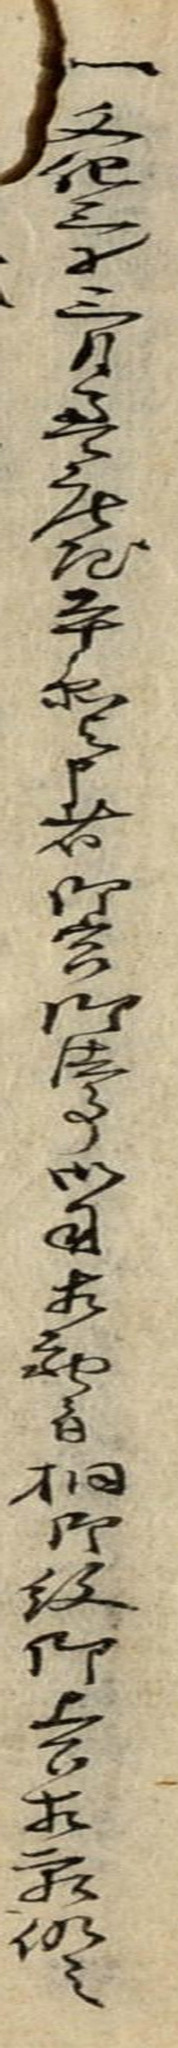一文化三寅三月畳庄屋平兵衛と申者御宮御法事御用相勤候付桐御紋御上下相願仍之
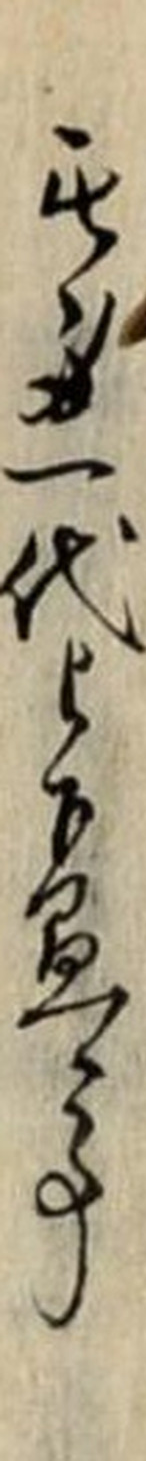其身一代被下置候事
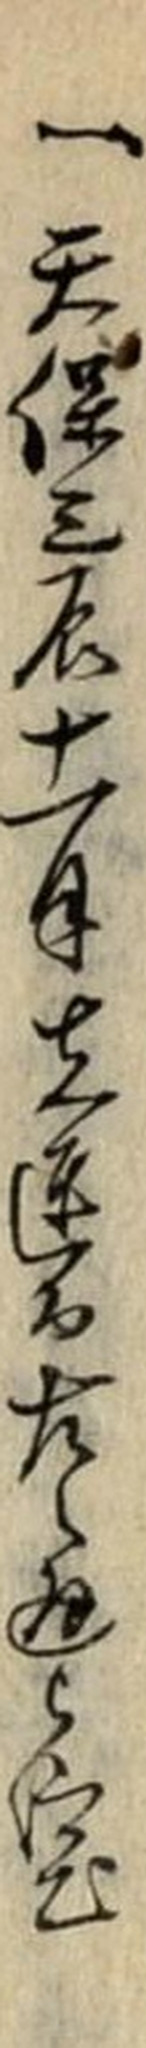一天保三辰十一月先達而左之通被仰出
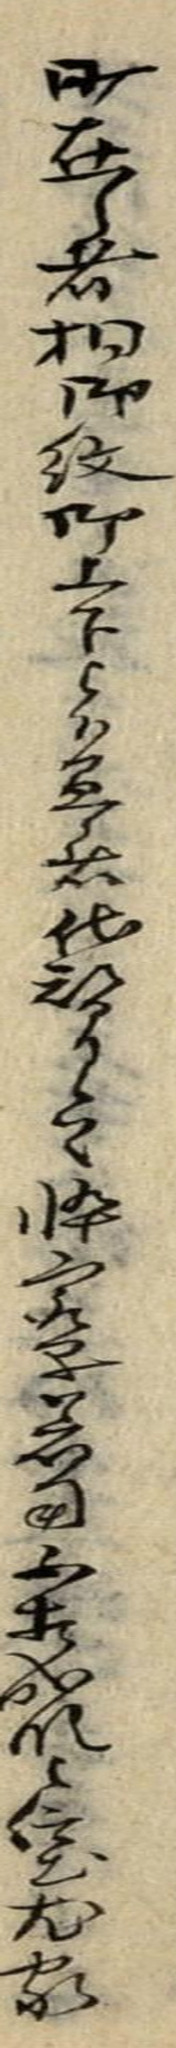町在之者桐御紋御上下被下置候者代替り候はゝ忰最早着用不相成段被仰出尤家
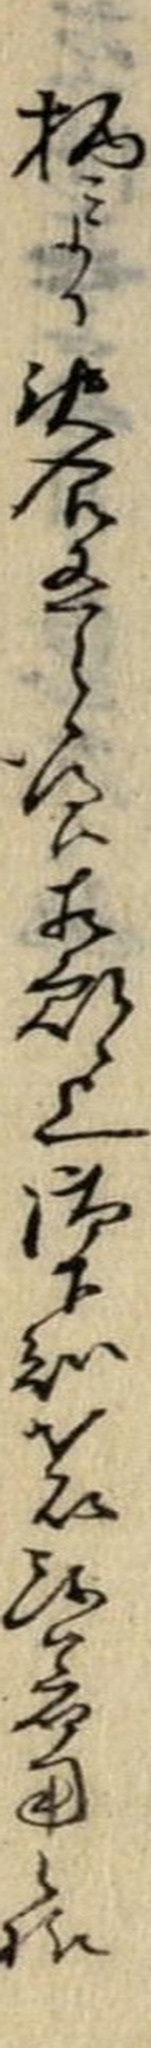柄により決合有之候得は相願候上御下知を以致着用候様
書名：蒐輯之部
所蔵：福井県文書館 Fukui Prefectural Archives
